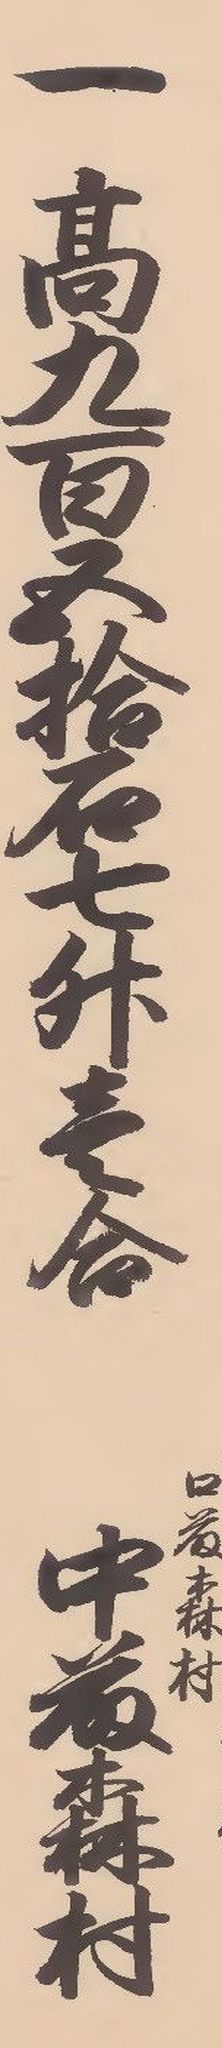一高九百五拾石七升壱合中藤森村
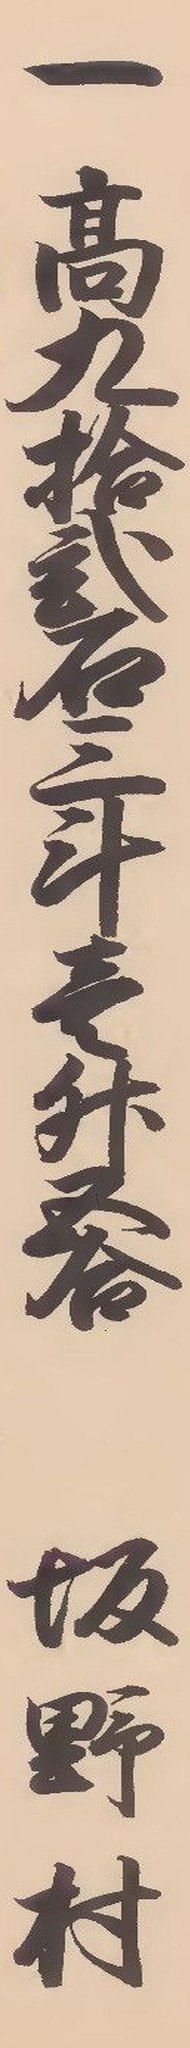一高九拾弐石三斗壱升五合坂野村

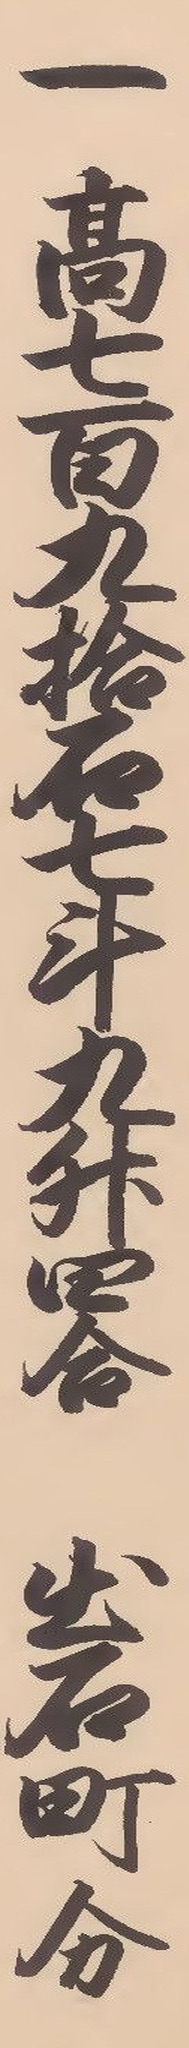一高七百九拾石七斗九升四合出石町分
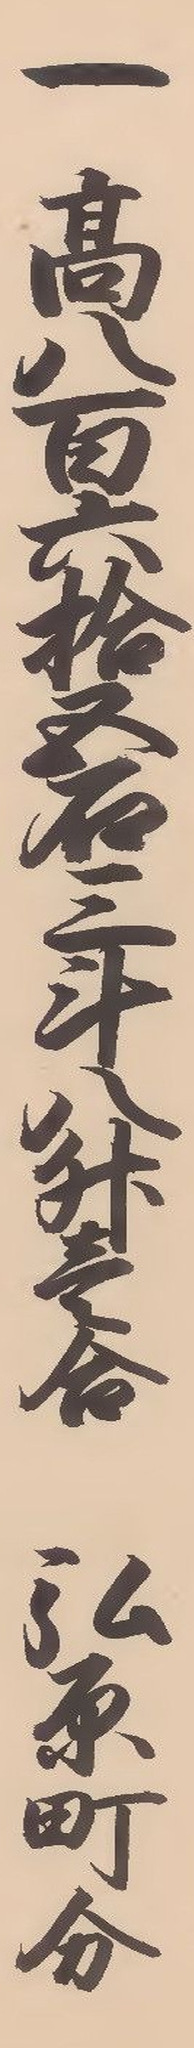一高八百六拾五石三斗八升壱合弘原町分
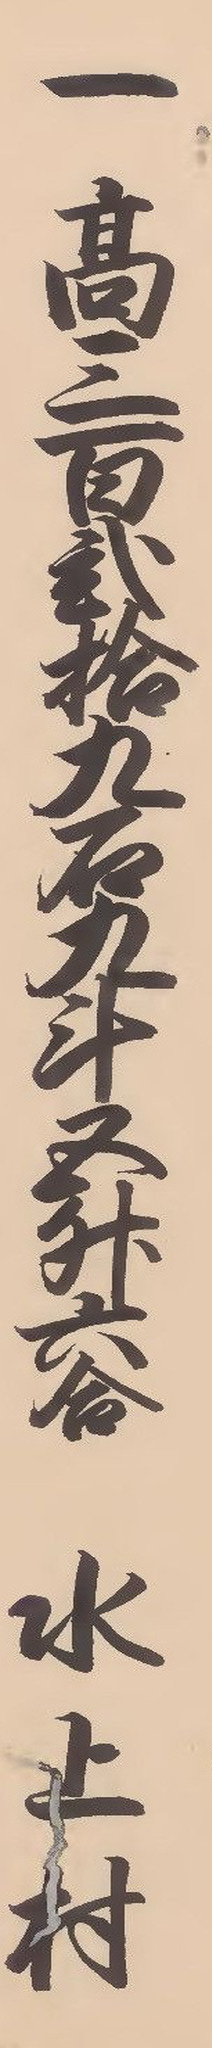一高三百弐拾九石九斗五升六合水上村
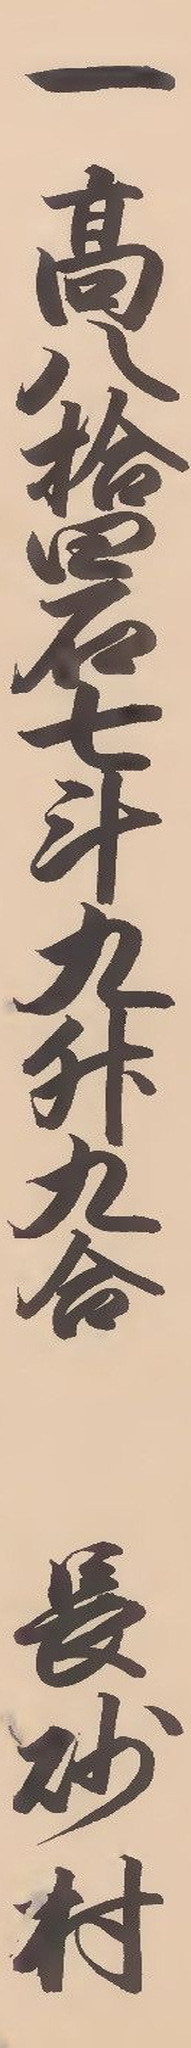一高八拾四石七斗九升九合長砂村
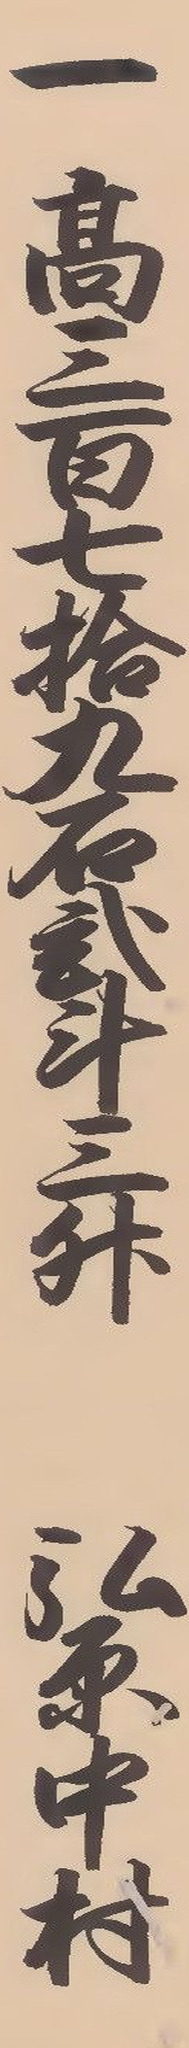一高三百七拾九石弐斗三升弘原中村
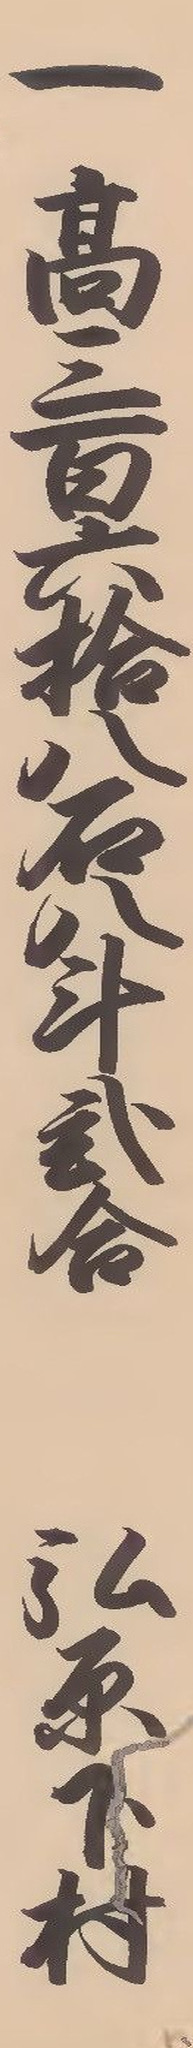一高三百六拾八石八斗弐合弘原下村
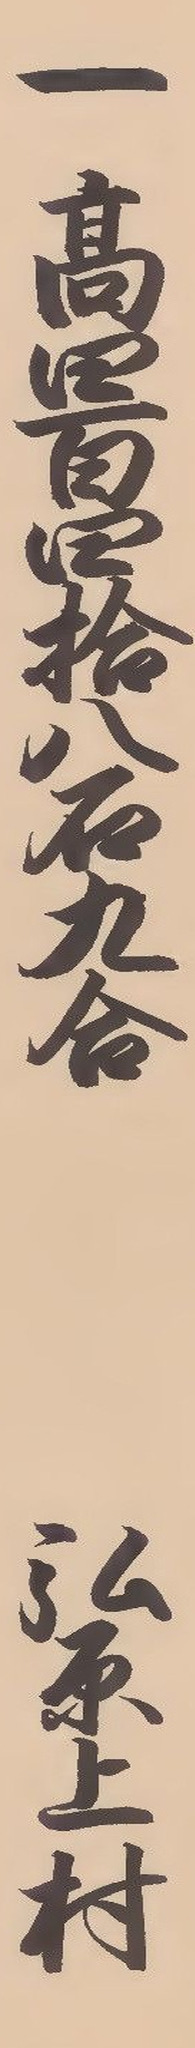一高四百四拾八石九合弘原上村
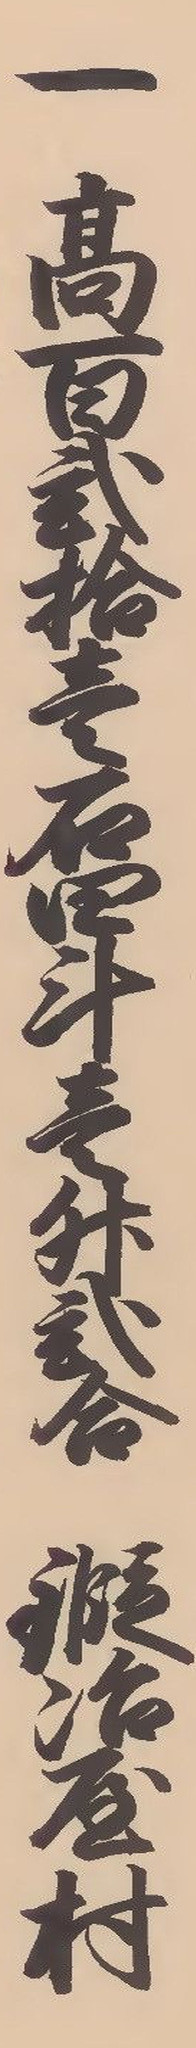一高百弐拾壱石四斗壱升弐合鍛冶屋村

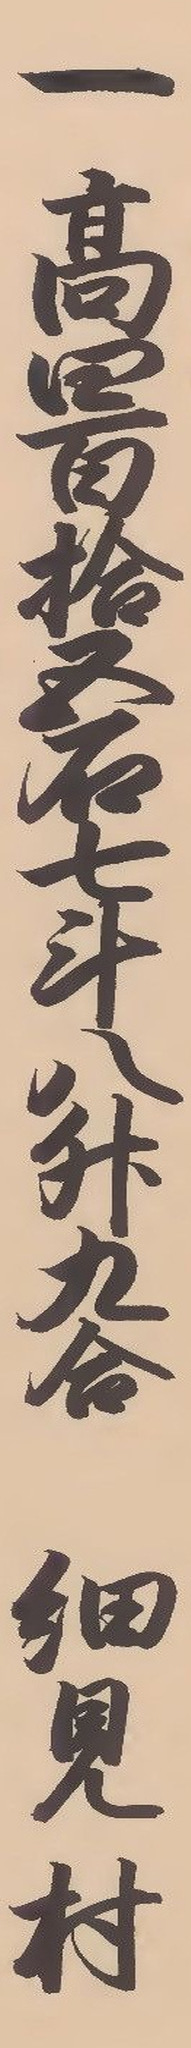一高四百拾五石七斗八升九合細見村
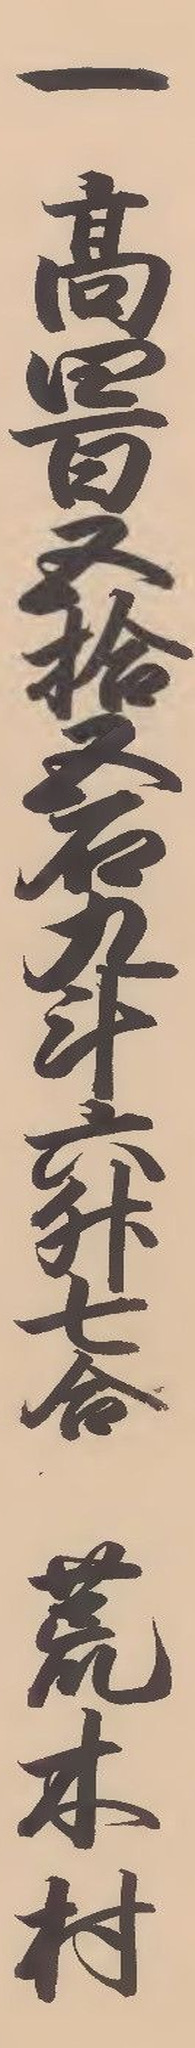一高四百五拾五石九斗六升七合荒木村
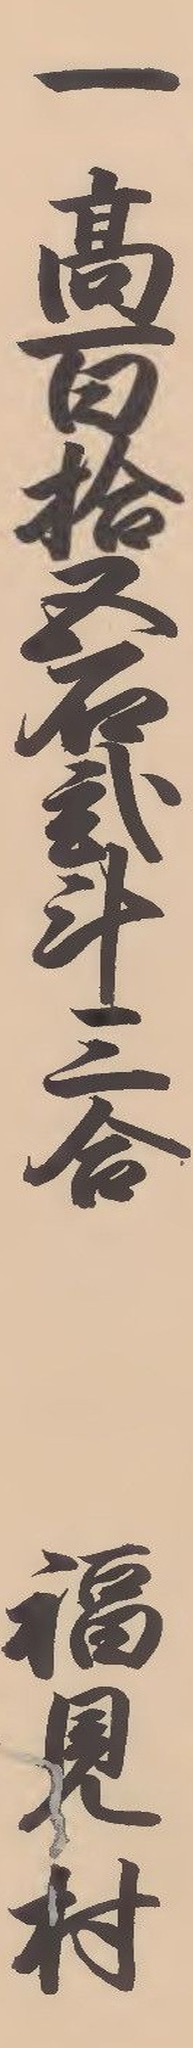一高百拾五石弐斗三合福見村
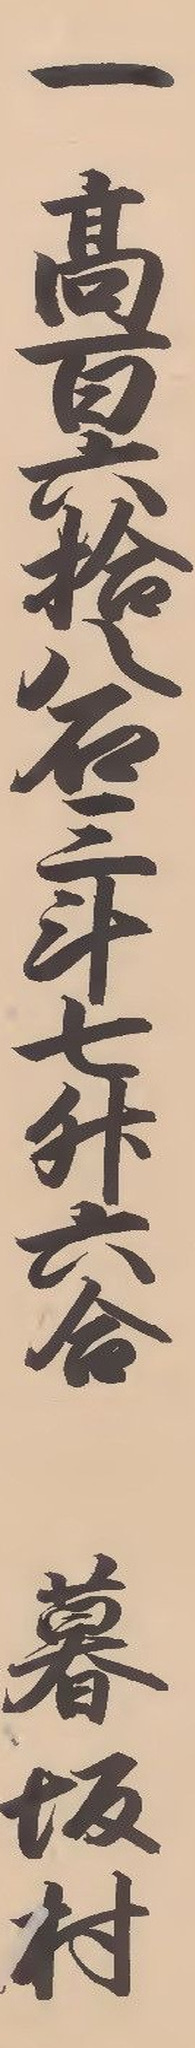一高百六拾八石三斗七升六合暮坂村
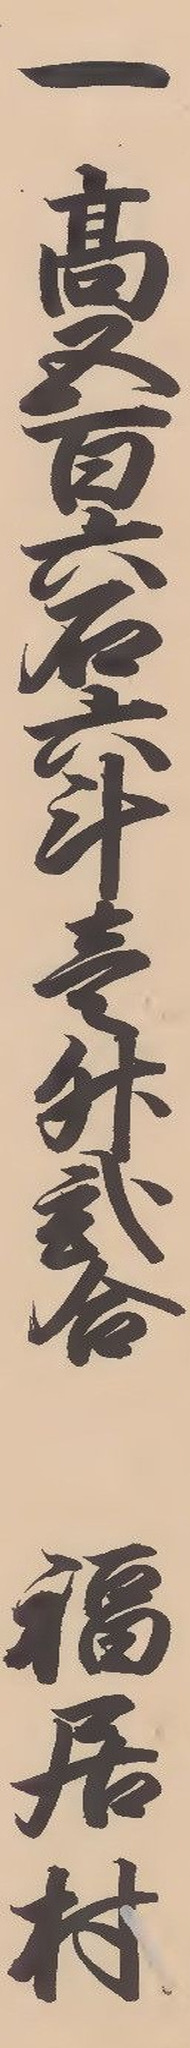一高五百六石六斗壱升弐合福居村
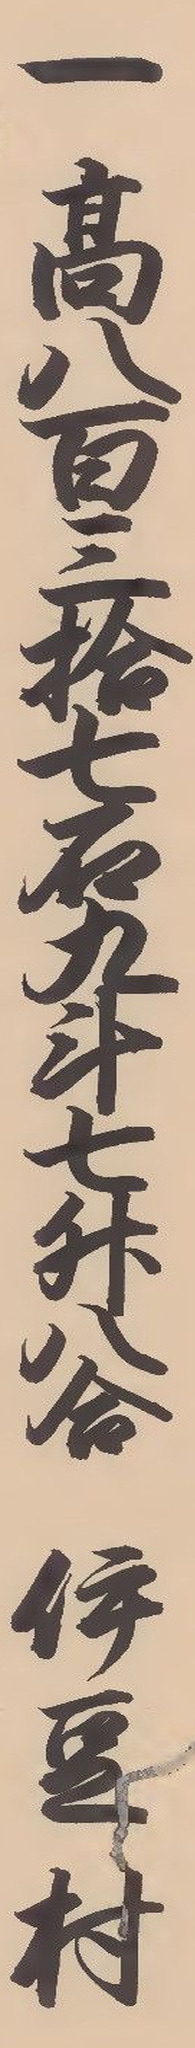一高八百三拾七石九斗七升八合伊豆村
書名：但馬国郷帳
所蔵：国立公文書館 National Archives of Japan
